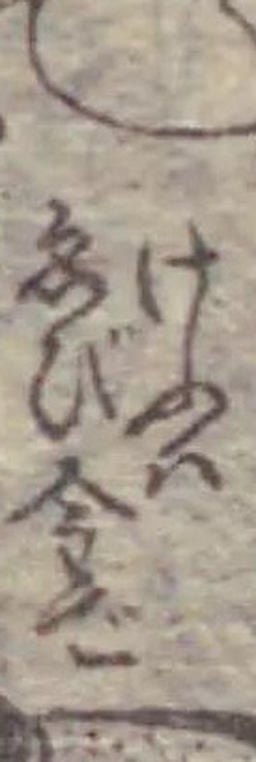ゑび金で
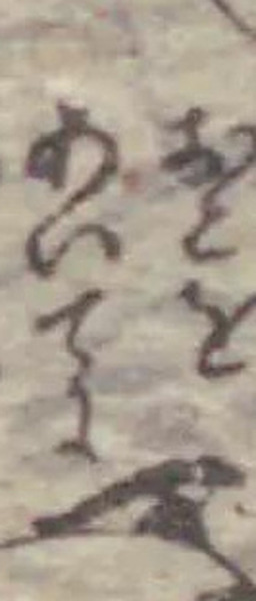あいてに
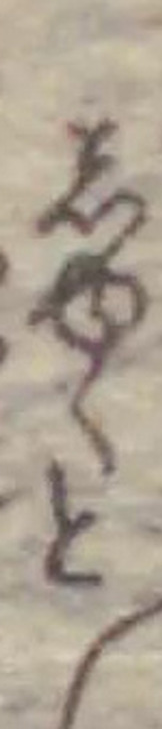しやくと
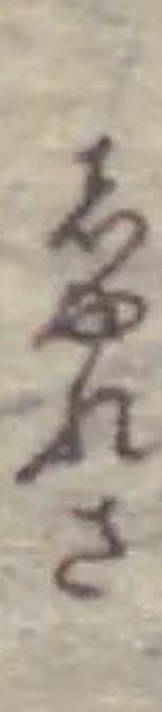しやれさ
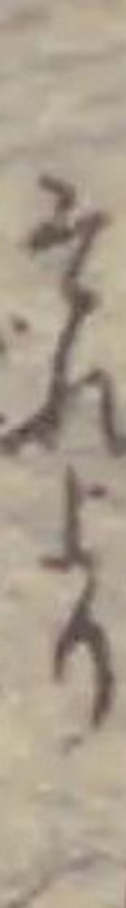それより
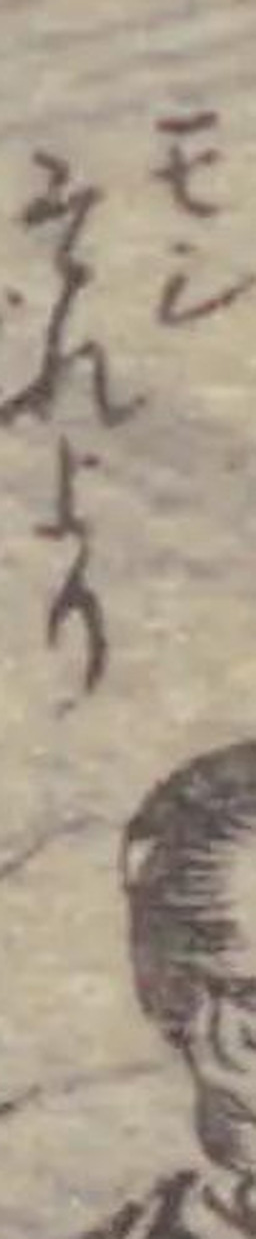それより
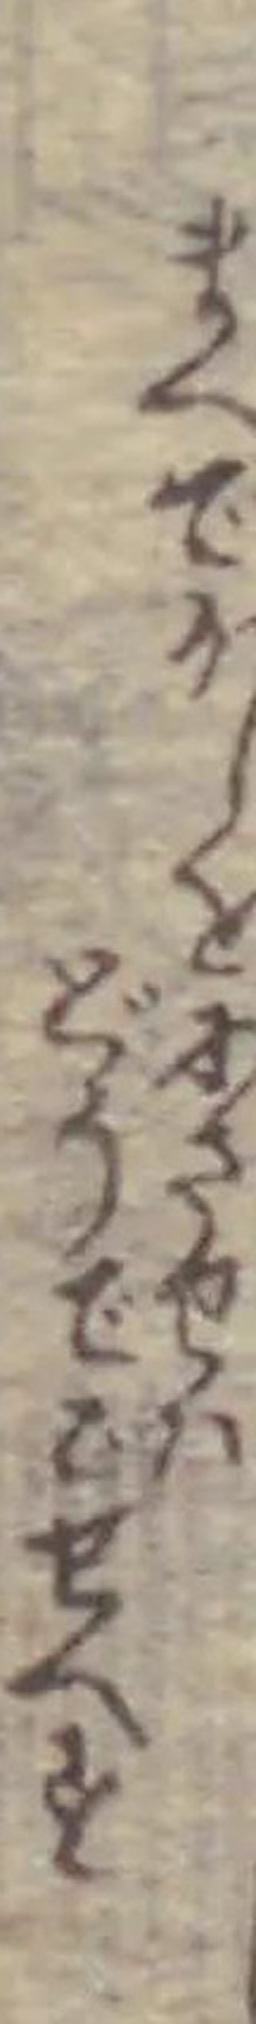どうでごぜへす
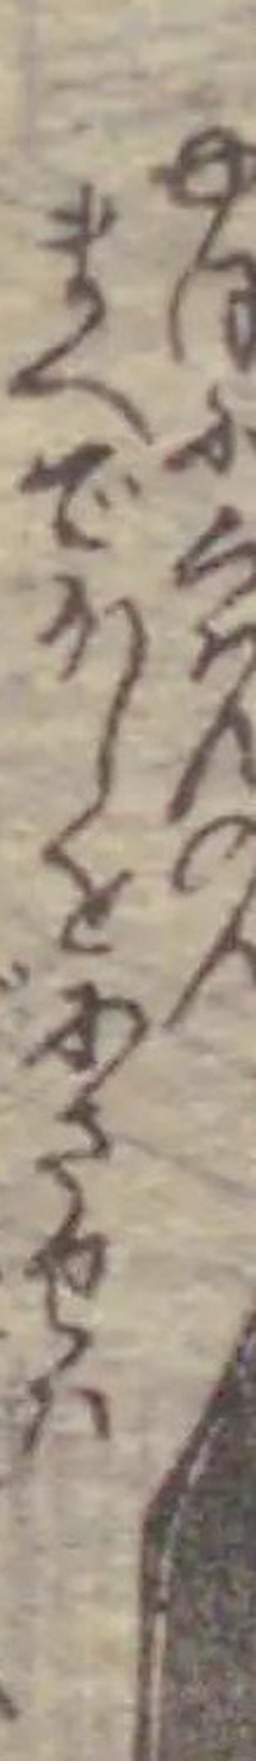まへでほしをにさせは
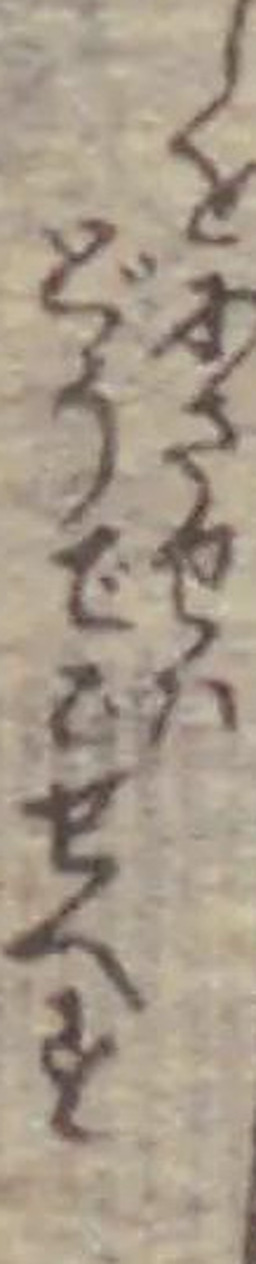どうでごぜへす
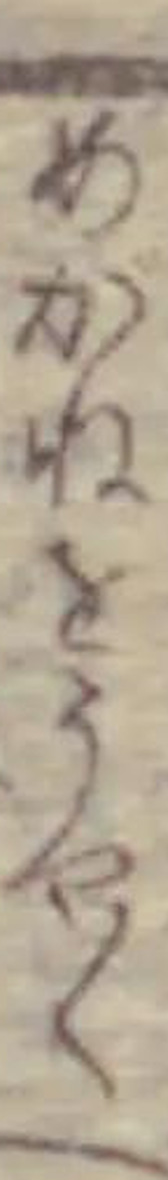めがねをうや〳〵
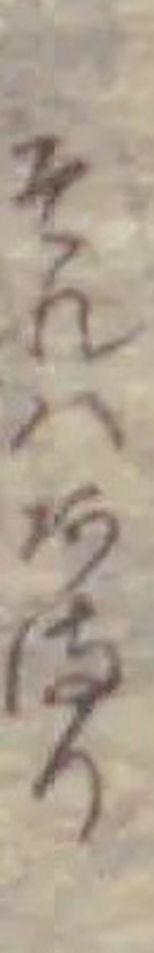それはあまり
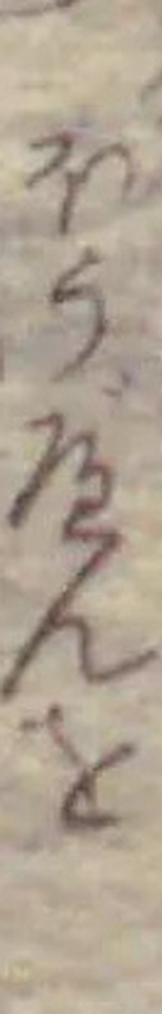ほうへんを
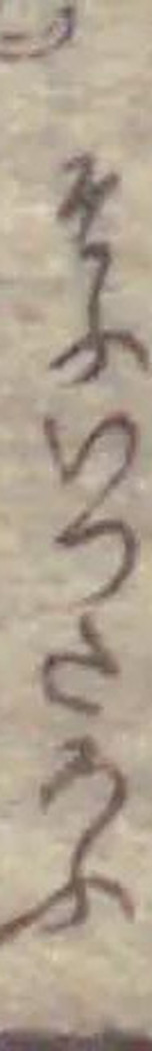そふいつたろふ
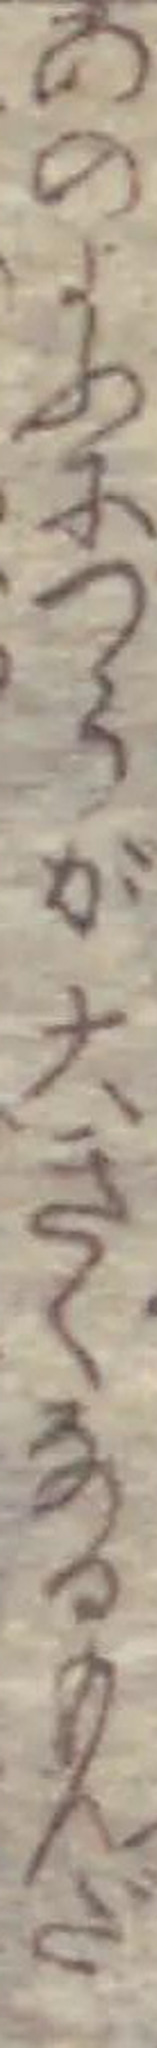あのよふにつらが大きくなるもんだ
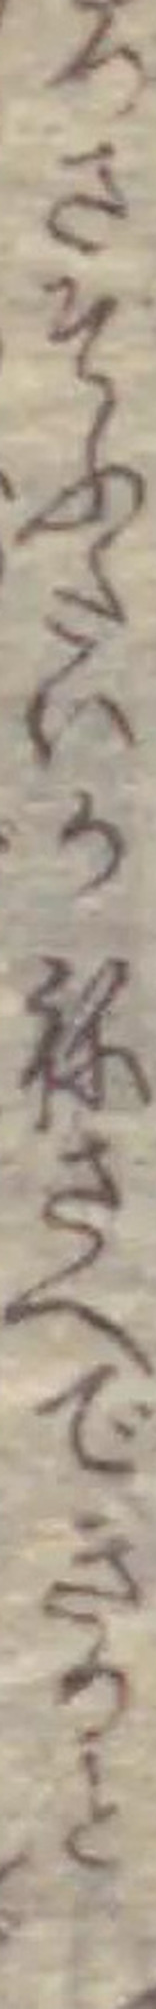やつさそふたいかねさへできると
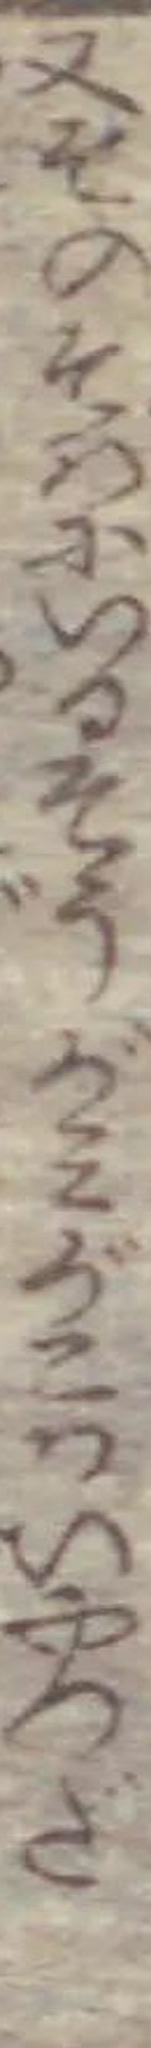又そのそはにいるそうがみがこわいやつだ
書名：化物大閉口 2巻
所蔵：国立国会図書館 National Diet Library, JAPAN
